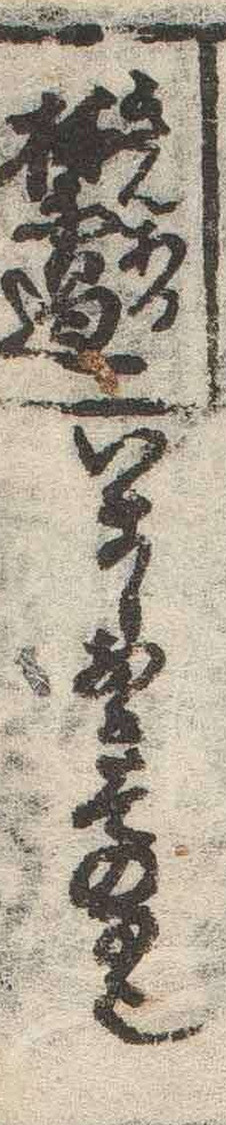禁遏いましおきての事也
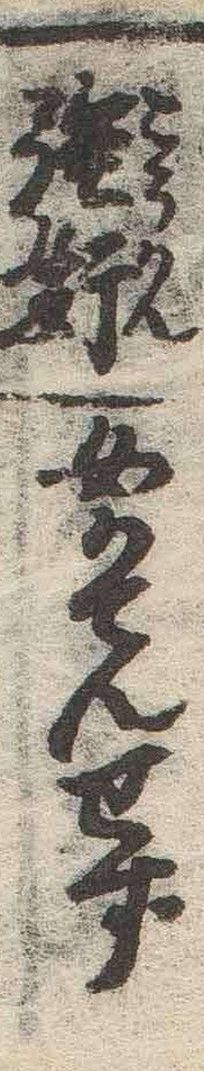強姧女かてんせず
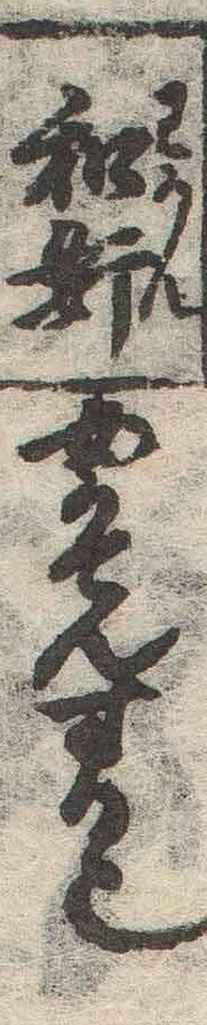和姧女かてんする也

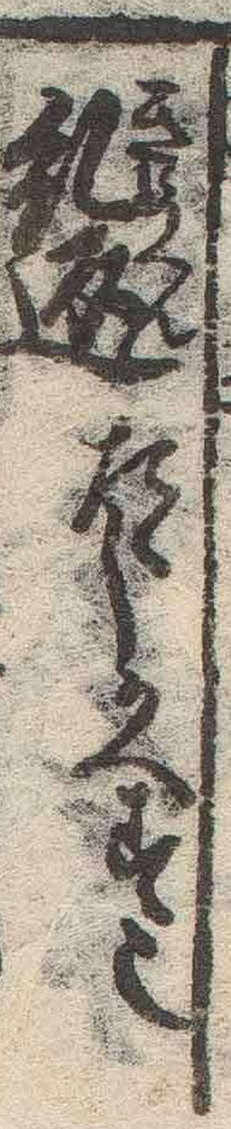糺返たゝしかへす也
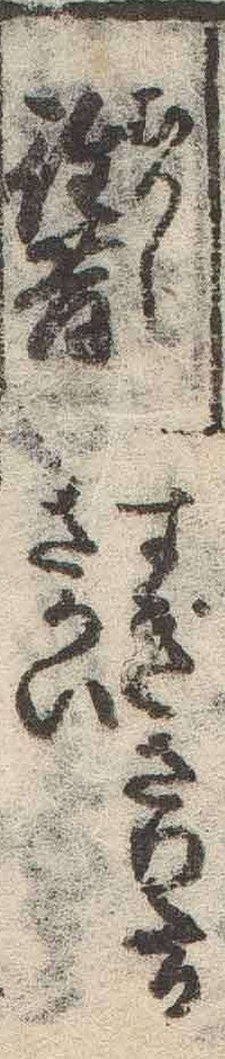往昔すぎさりたる
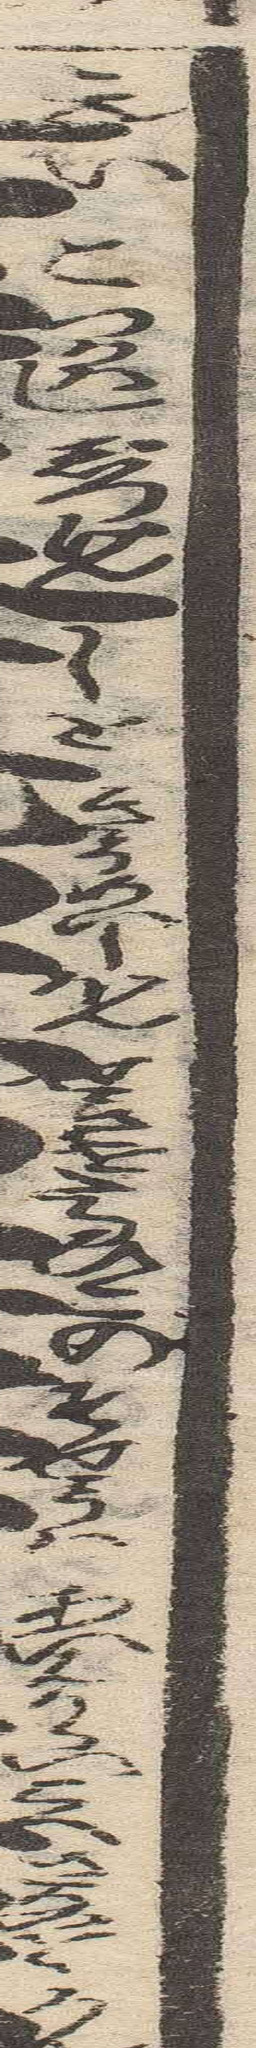こんいこつかはしじつけんしをきうめいしほんせきをたるひこのそせうはあいはからいこへさかいをろん
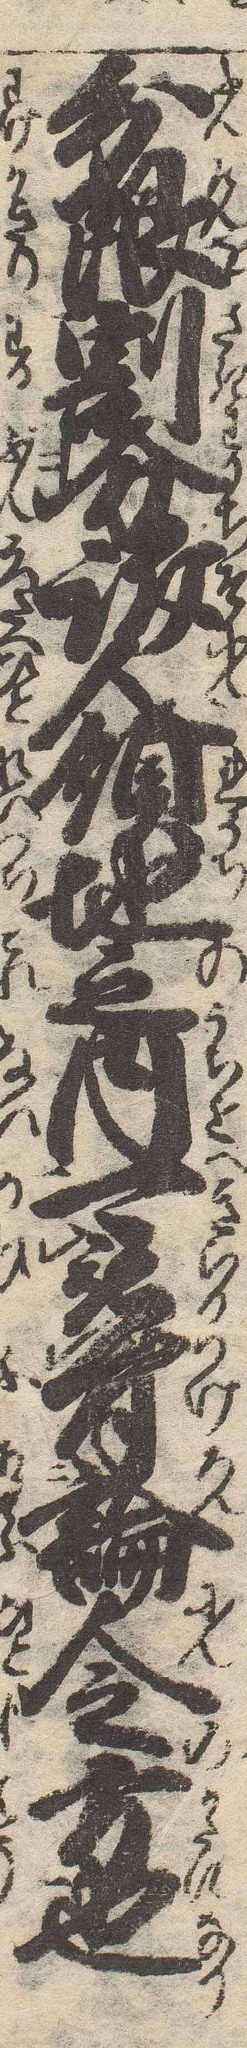分限割-分訴人領地之内可被付論人之方也
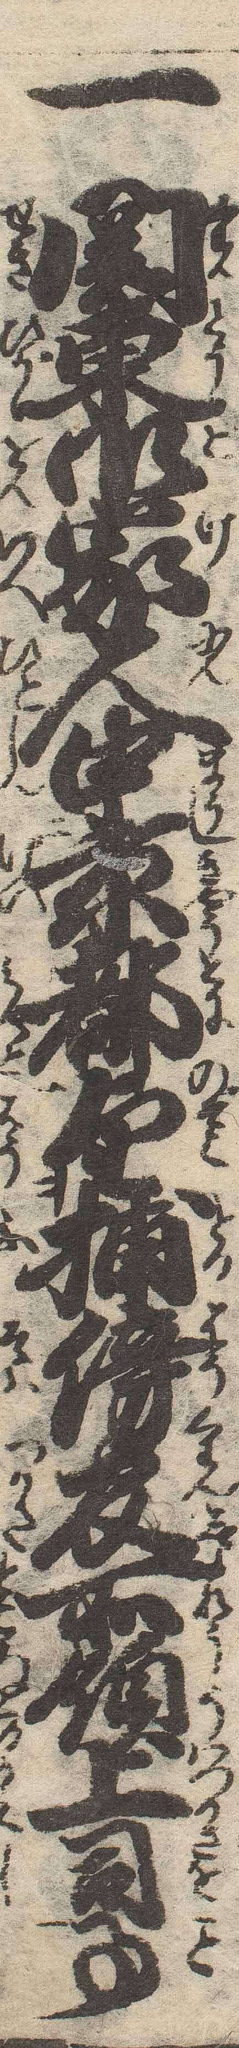一関東御家人申京都望-捕傍官所領上司事
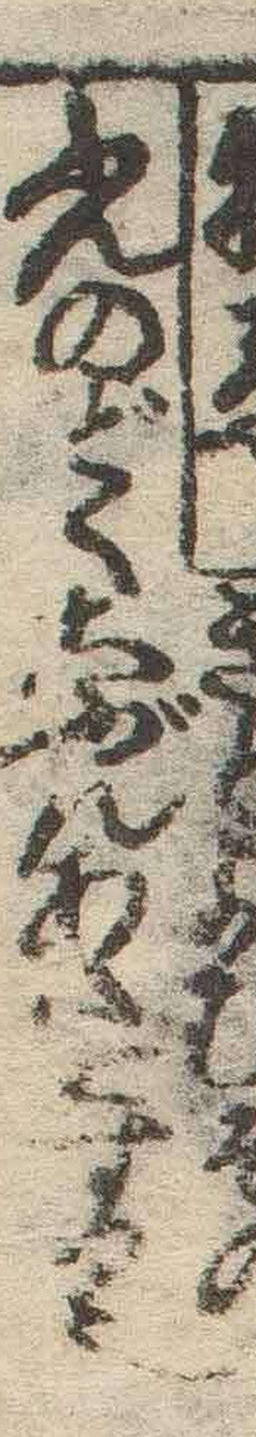にんのごとくこぶんあたをする也
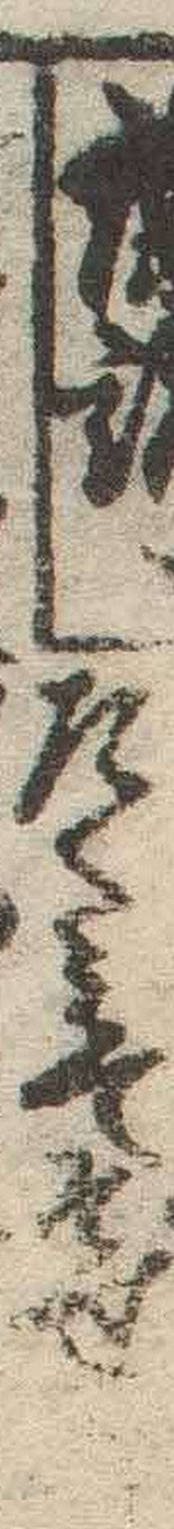たくみてそせう
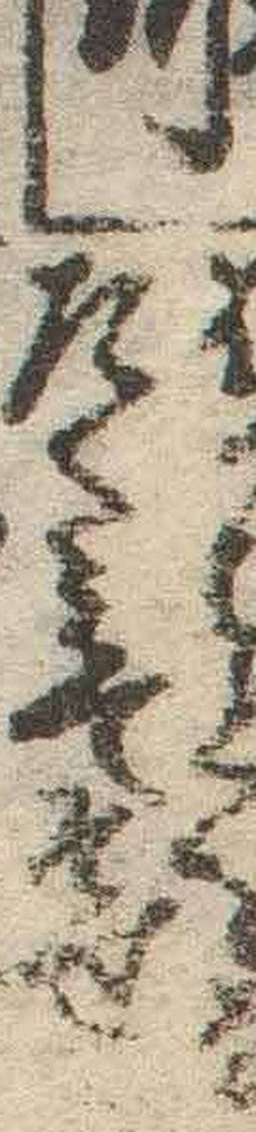たくみてそせう
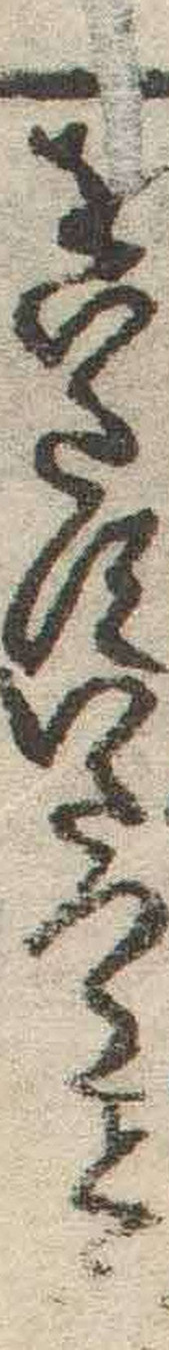をいたすいたつらと也
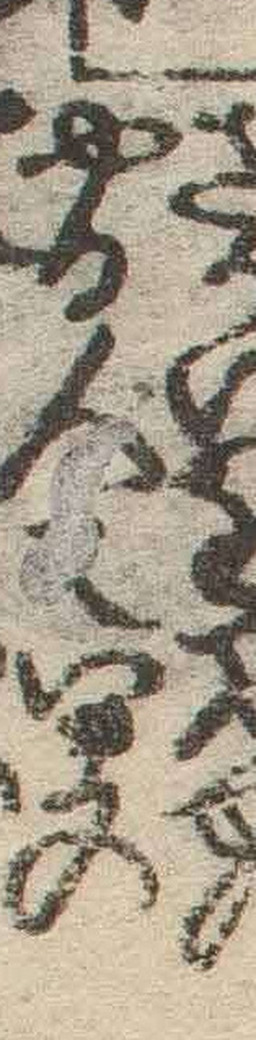やる人也いまの
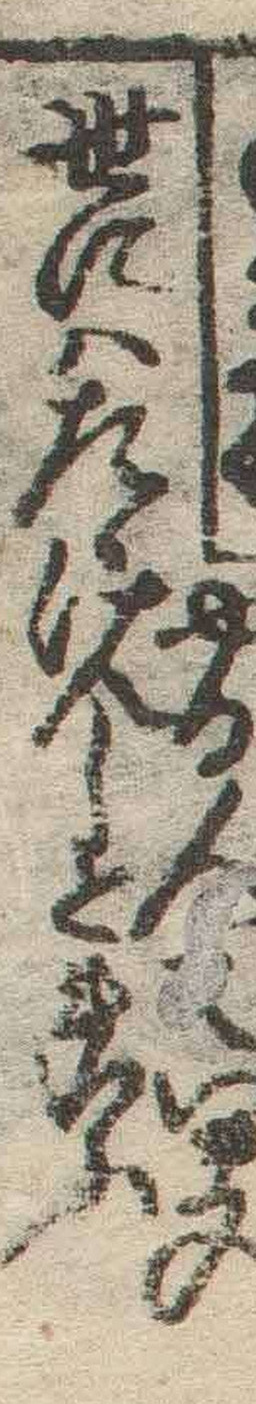世にはたゝけんしともいふ

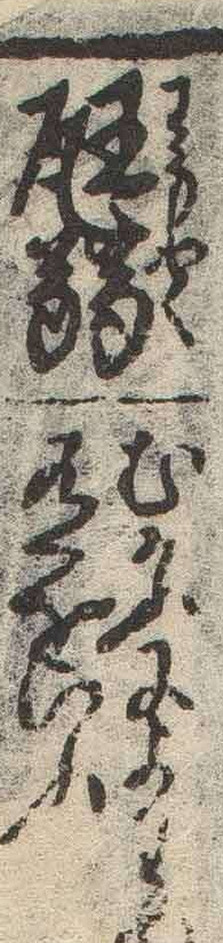有をいふ
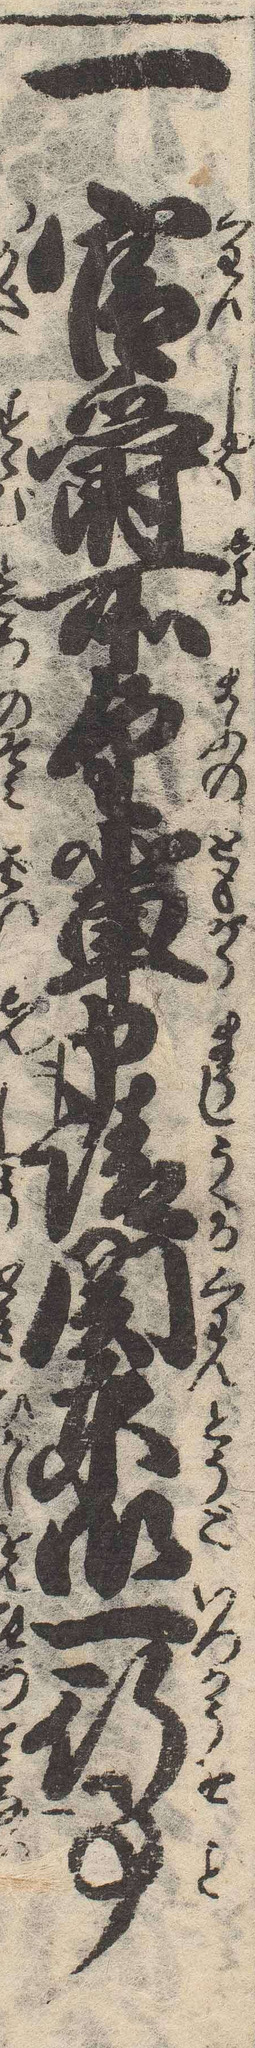一官爵所望輩申-請関東御一行事
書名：御成敗式目絵抄
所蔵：東京学芸大学附属図書館 国文学研究資料館
